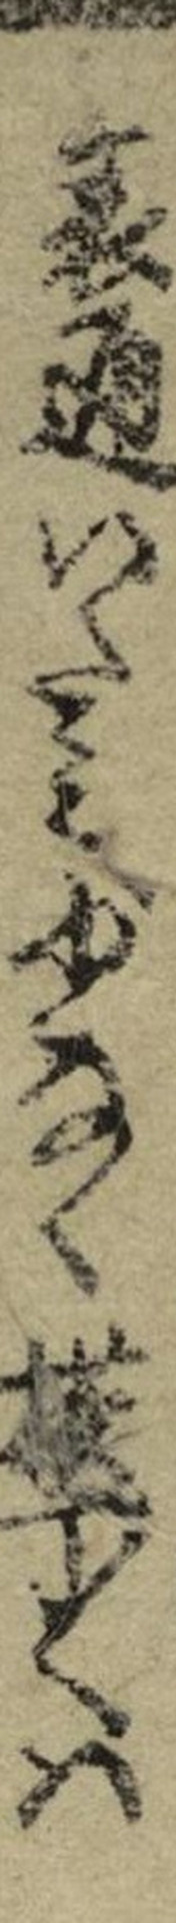表通いたみ少なく横丁〳〵は
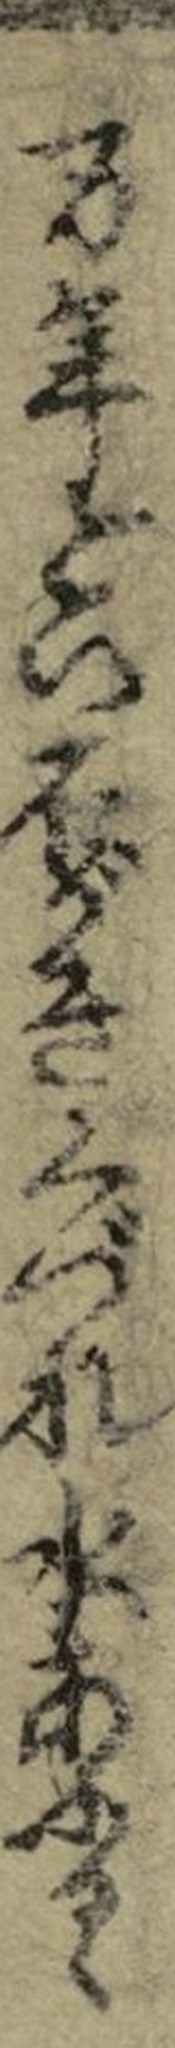万年どい石がきくづれ水あふるゝ
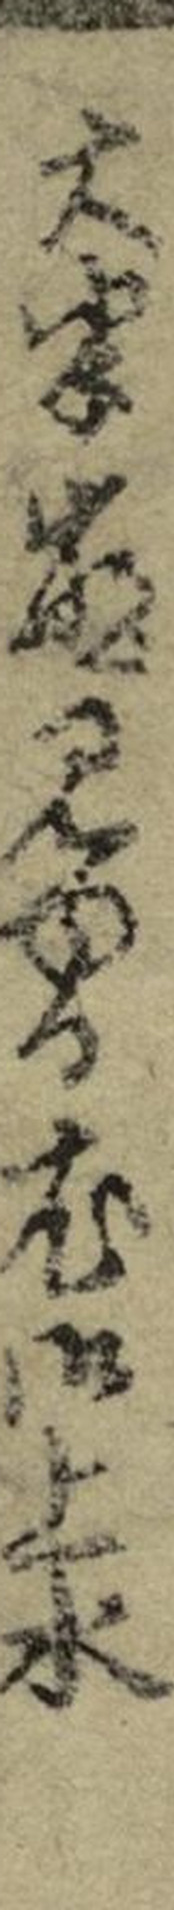大半崩見ゆる尤御上水
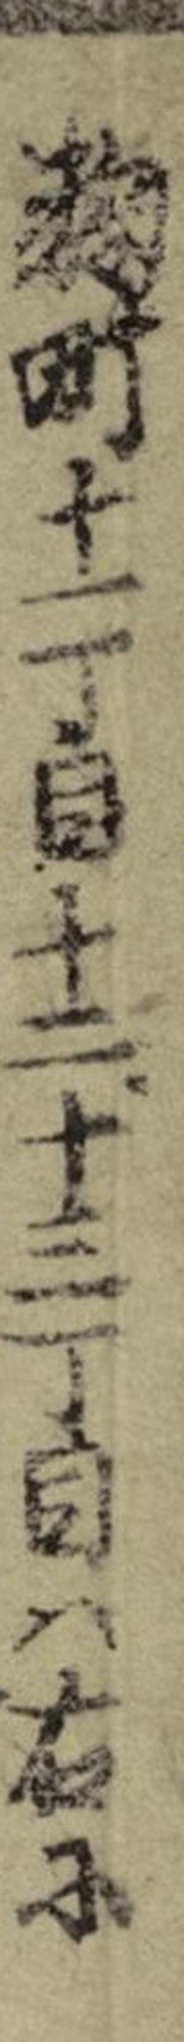麹町十一丁目十二十三丁目は右に
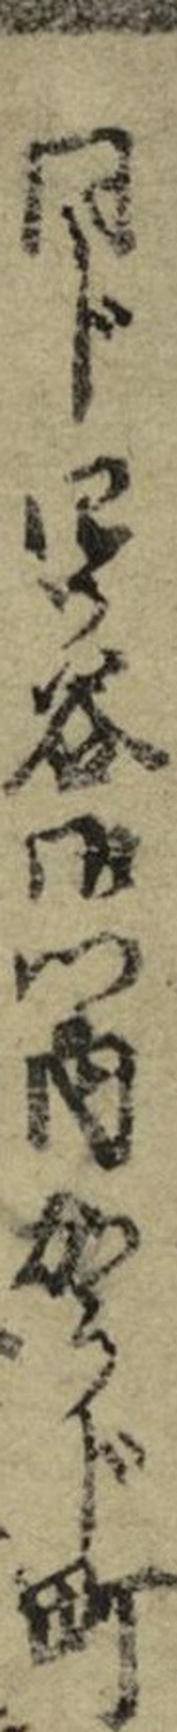同じ四ツ谷御門内かうじ町は
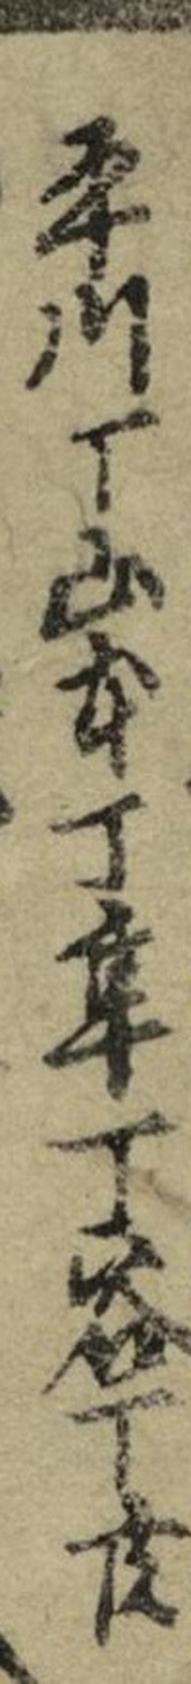平川町山本丁隼丁谷丁共
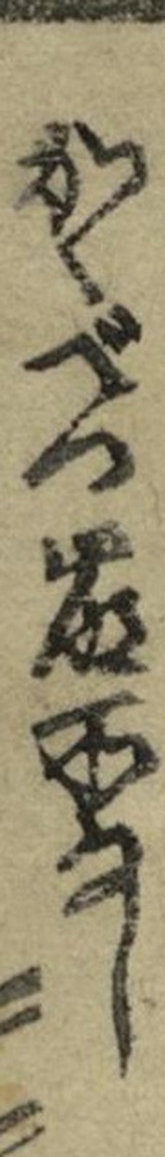かくべつ崩所なし
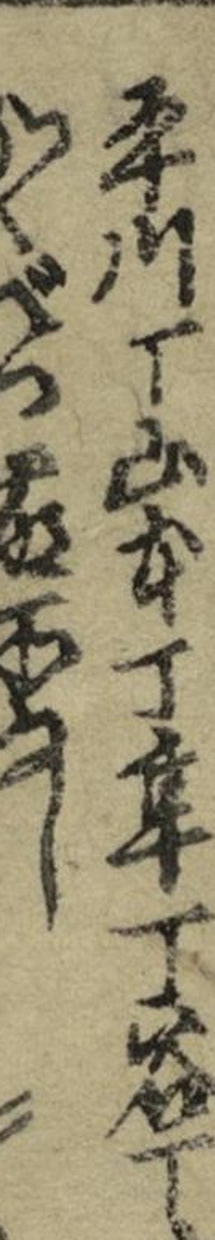かくべつ崩所なし
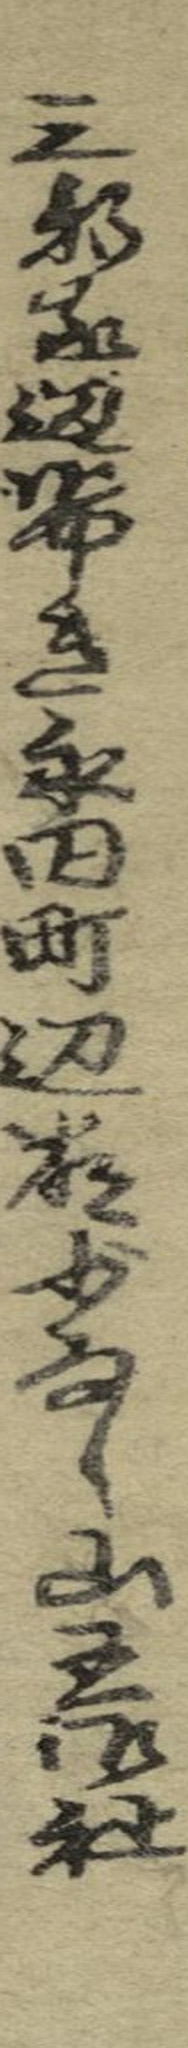三軒家辺御やしき永田町辺崩少なく山王御社
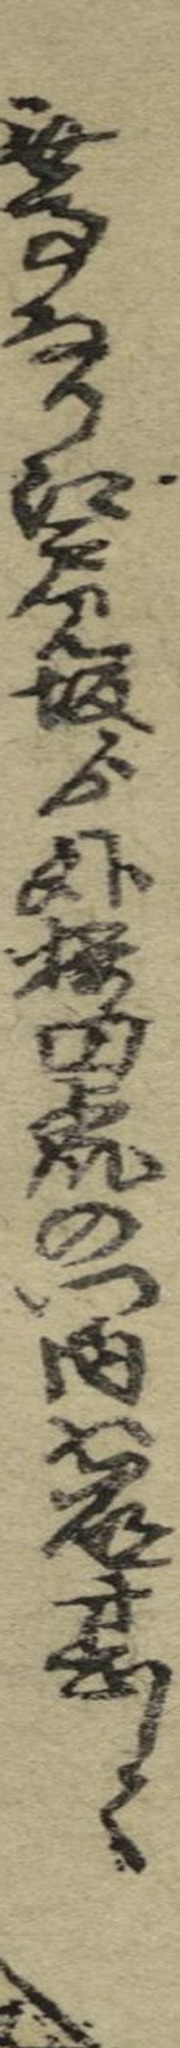無事なり江戸見坂ゟ外桜田虎の門内は崩甚しく
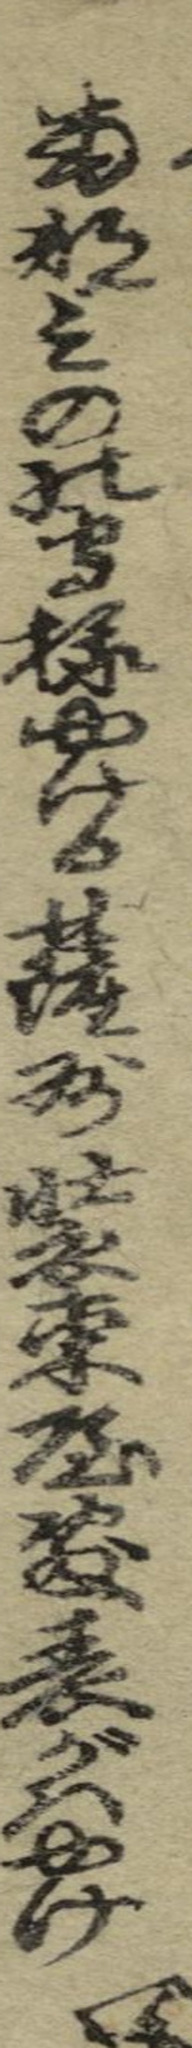南部みのの守様やける薩州装束屋敷表がはやけ
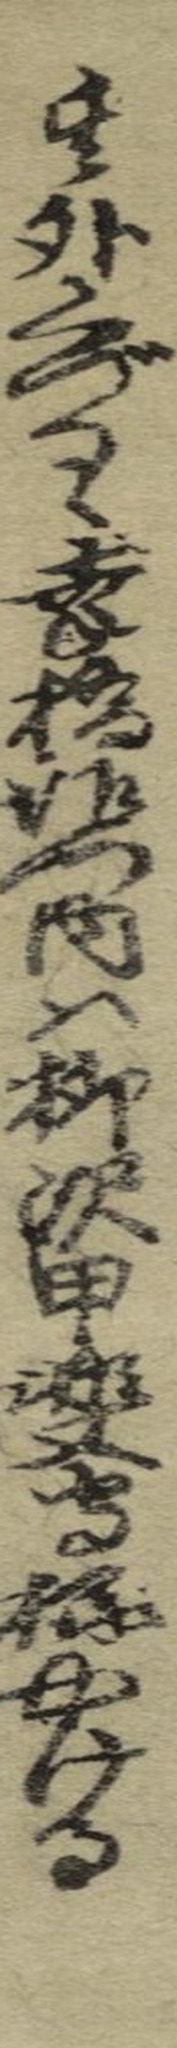其外くづるゝ幸橋御門内は柳沢甲斐守様やける
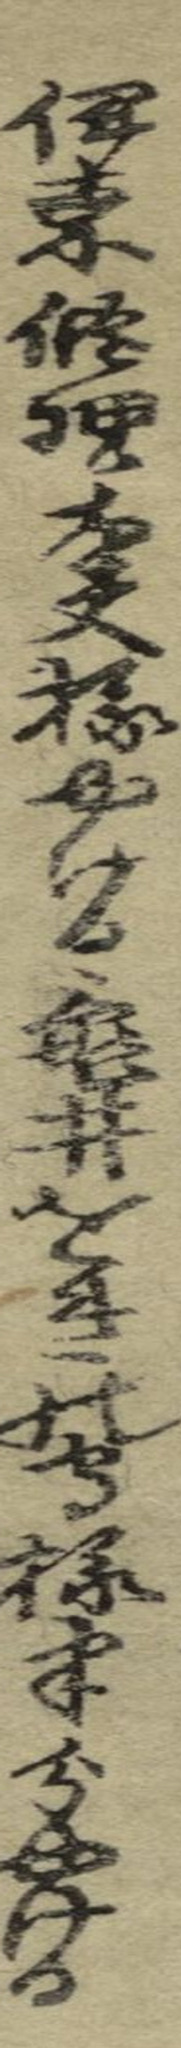伊東修理大夫様やける亀井をきの守様半分やける
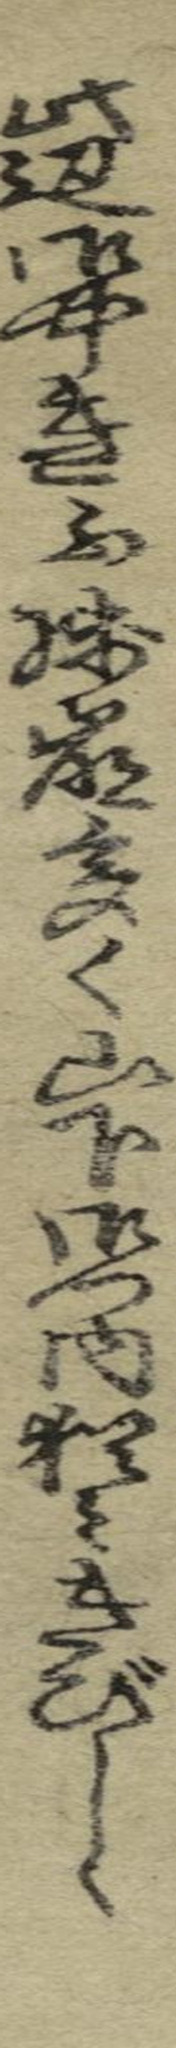此辺御やしき不残崩多く山下御門内程々きびしく
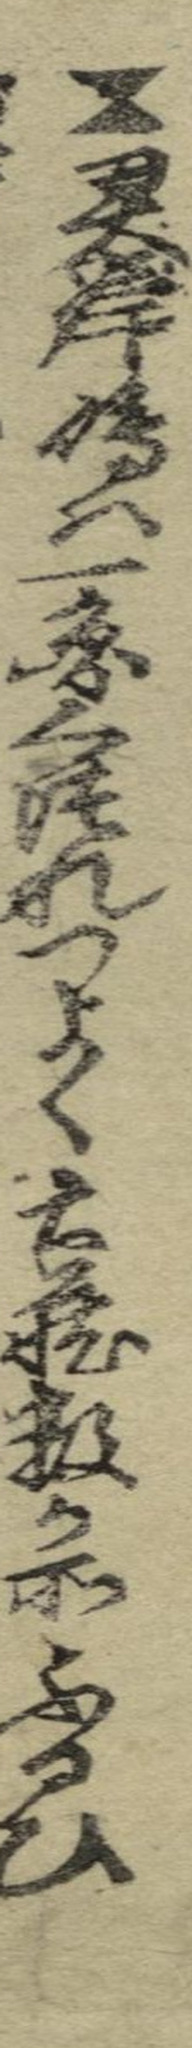⏳霊岸嶋は一円くつれつよく土蔵数か所ふるひ
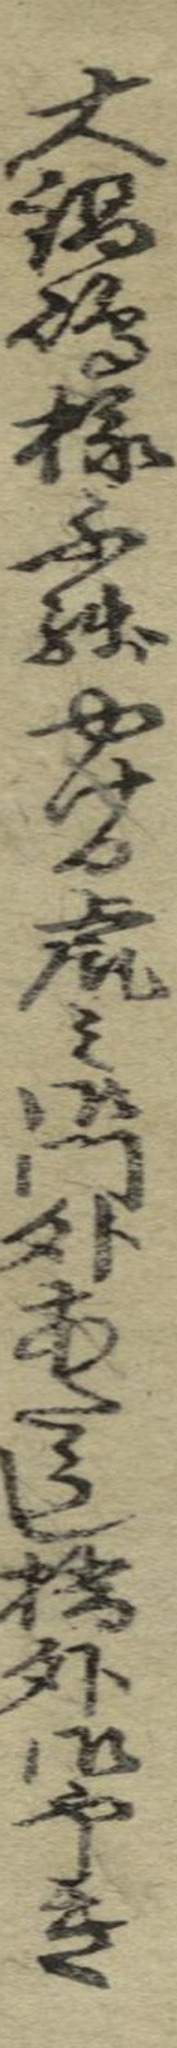大鍋嶋様不残やける虎之御門外あたらし橋外御やしき
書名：安政二年十月二日大地震并出火場所方角巨細
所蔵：東京大学地震研究所図書室 Earthquake Research Institute Library, The University of Tokyo, JAPAN
